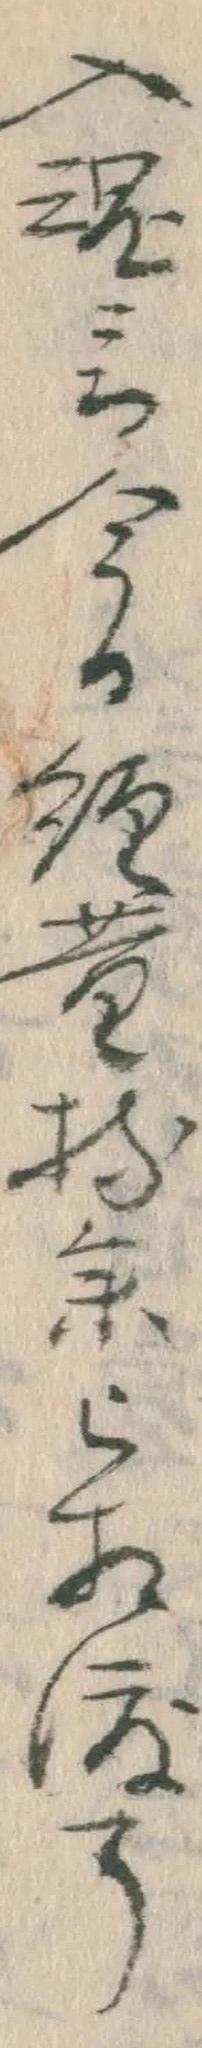入魂ニ而今日経董持参被相渡了
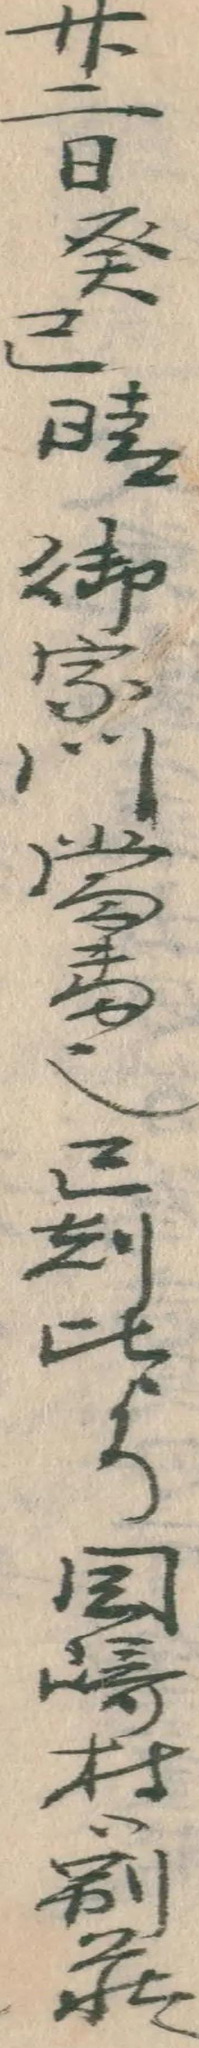廿二日癸巳晴御家門當番也巳刻頃より関崎村御別荘
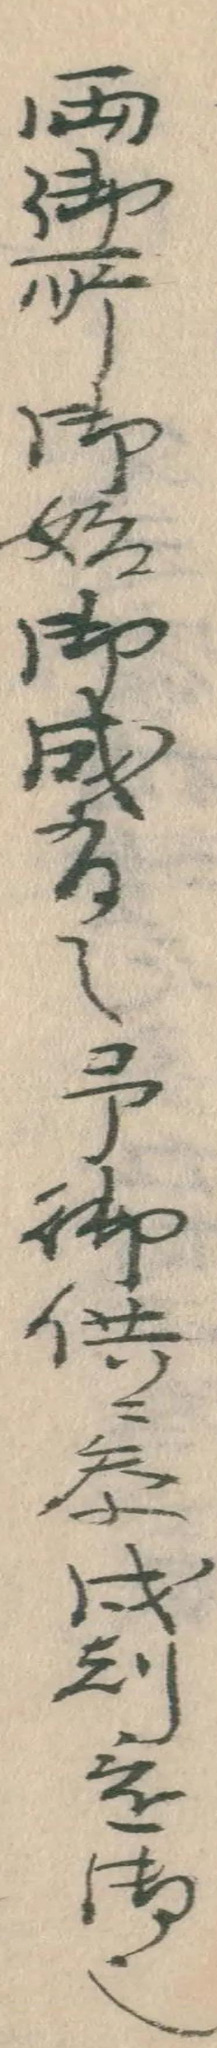両御所御始御成有之予御供二参戌刻還御也
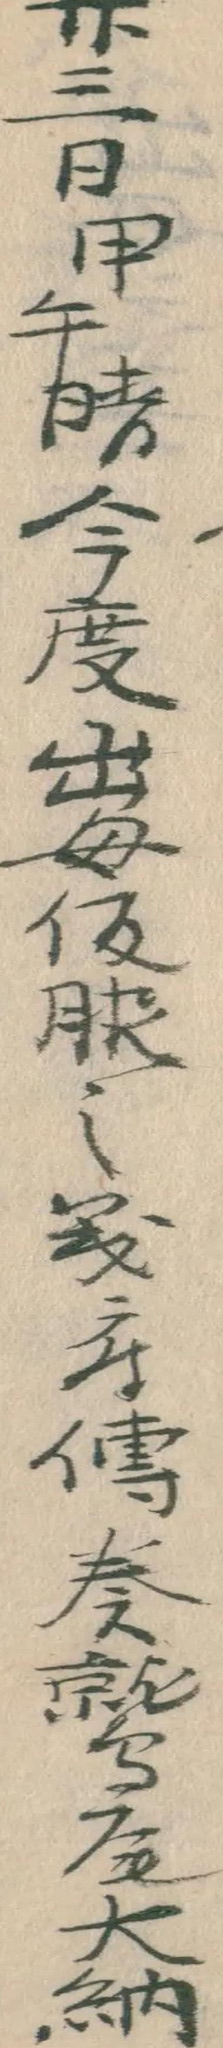廿三日甲午晴今度出母仮服之義ニ付傳奏鷲尾大納
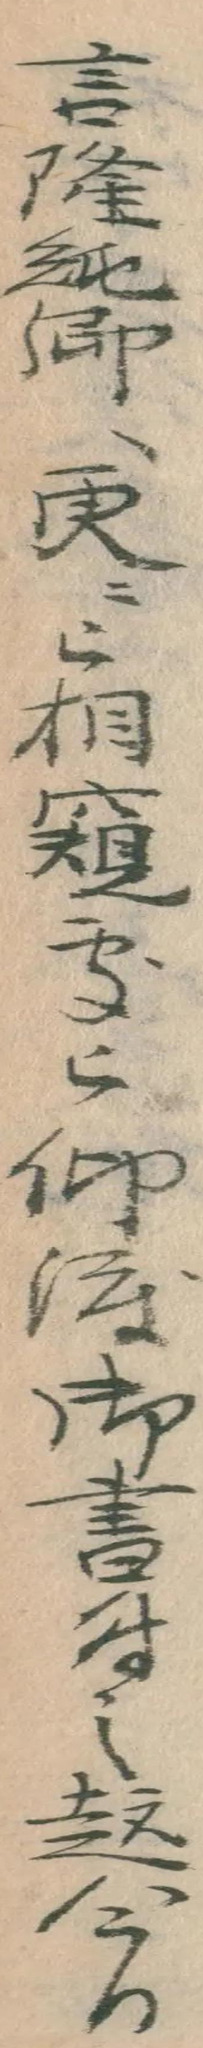言隆純卿へ更ニ被相窺處被仰渡御書付之趣今日

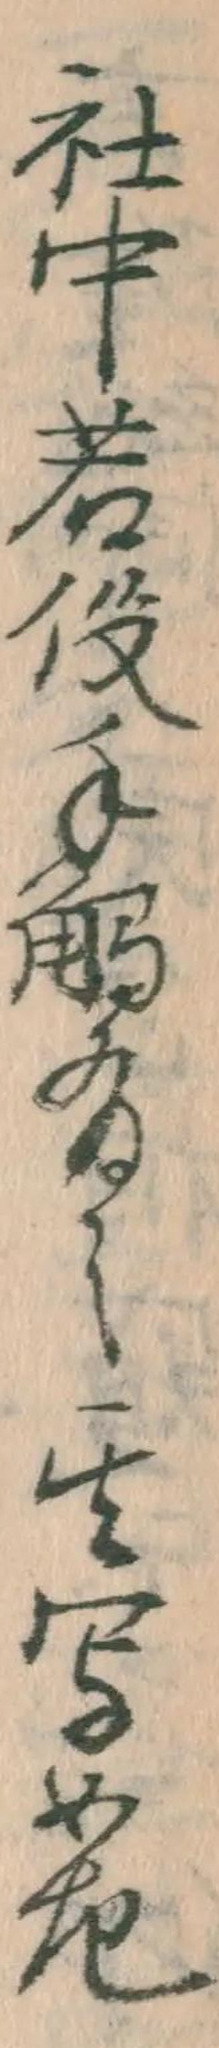社中若役手触有之其写如左
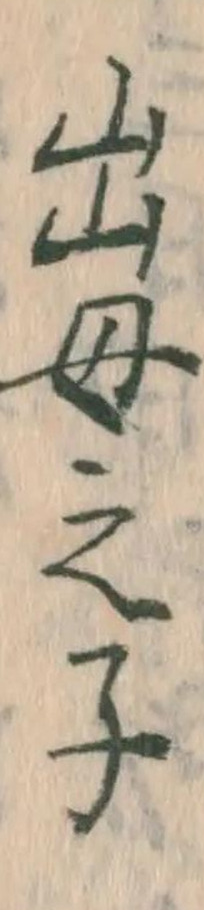出母之子
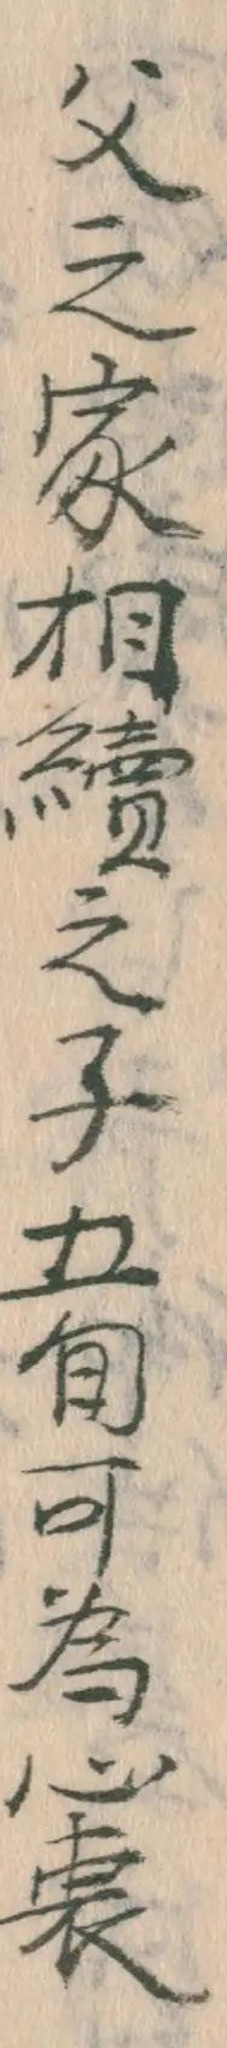父之家相續之子五旬可為心衷
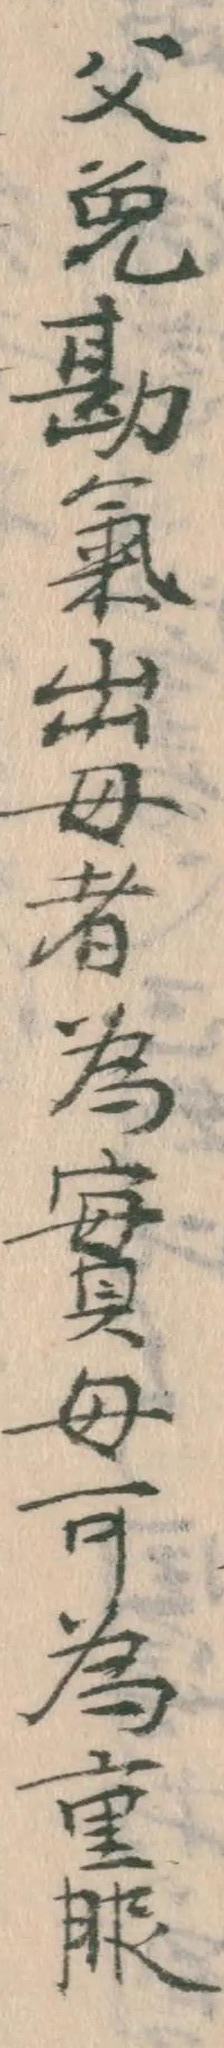父免勘氣出母者為實母可為重服
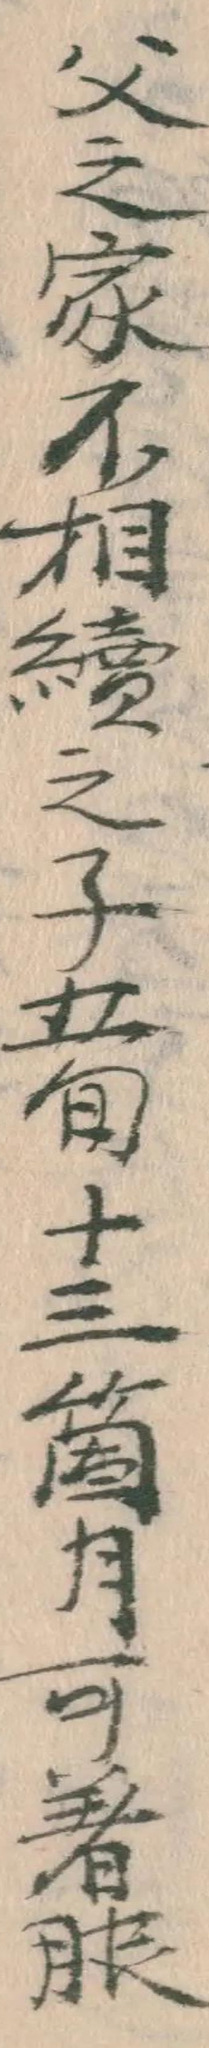父之家不相續之子五旬十三箇月可着服
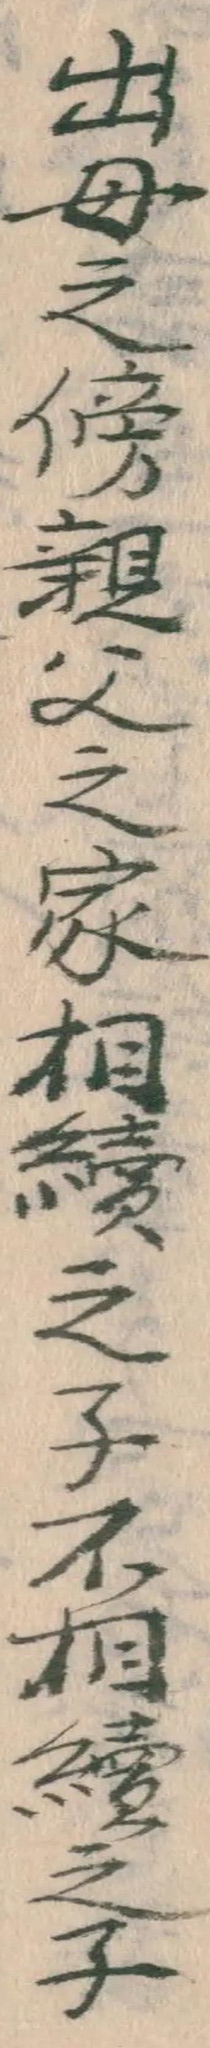出母之傍親父之家相續之子不相續之子
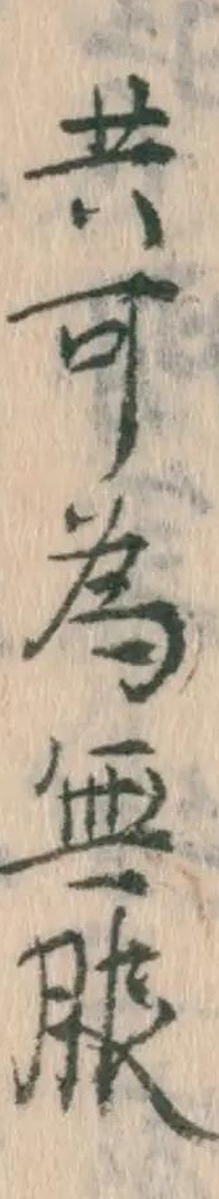共可為無服
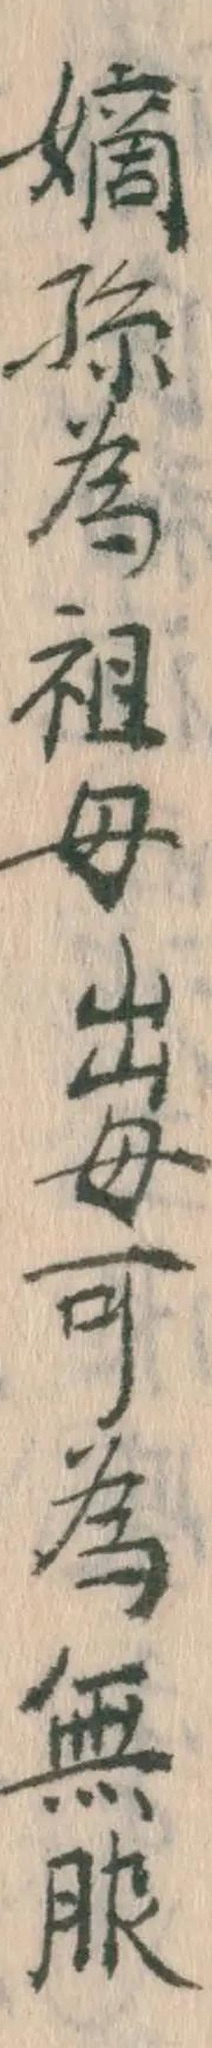嫡孫為祖母出母可為無服
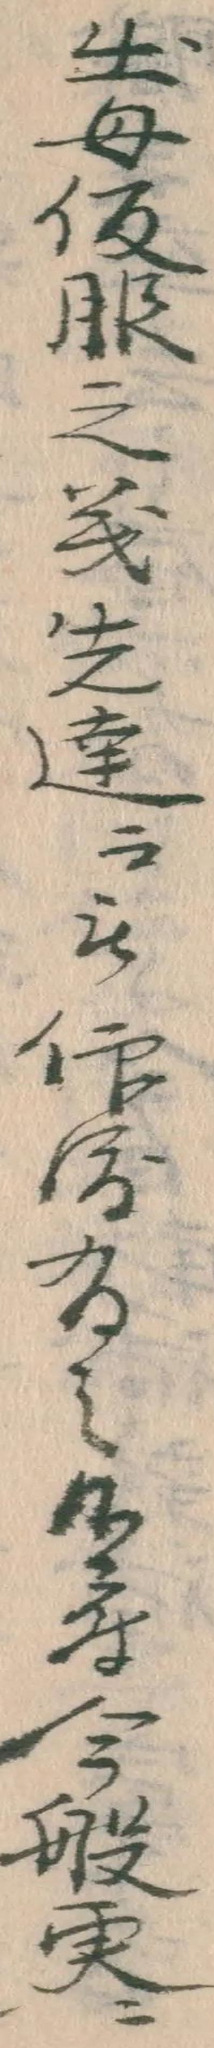出母仮服之義先達而被仰渡有之候ニ付今般更ニ
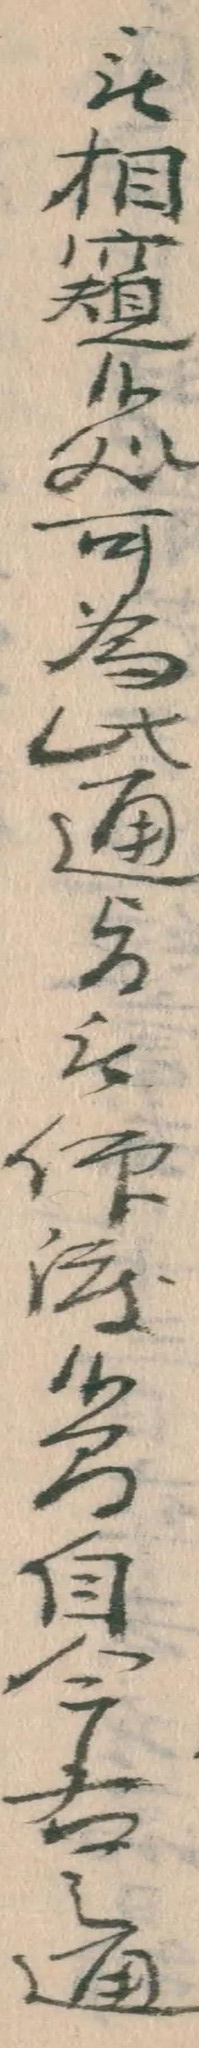被相窺候処可為此通旨被仰渡候間自今右之通
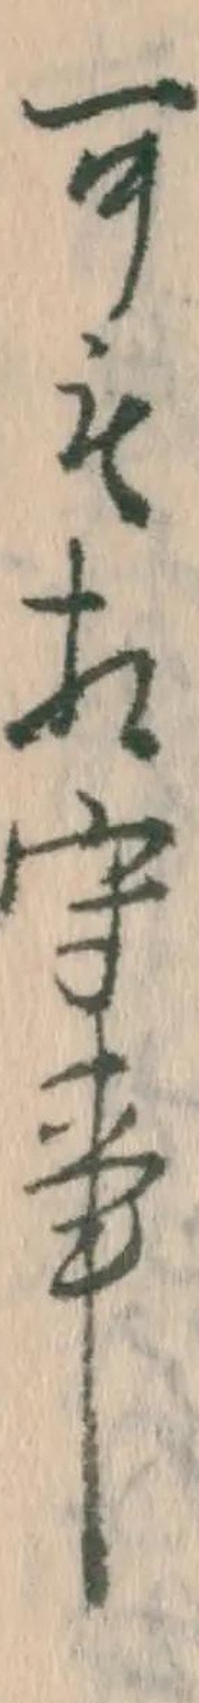可被相守事
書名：賀茂社記録. 第63冊
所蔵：国立国会図書館 National Diet Library, JAPAN
